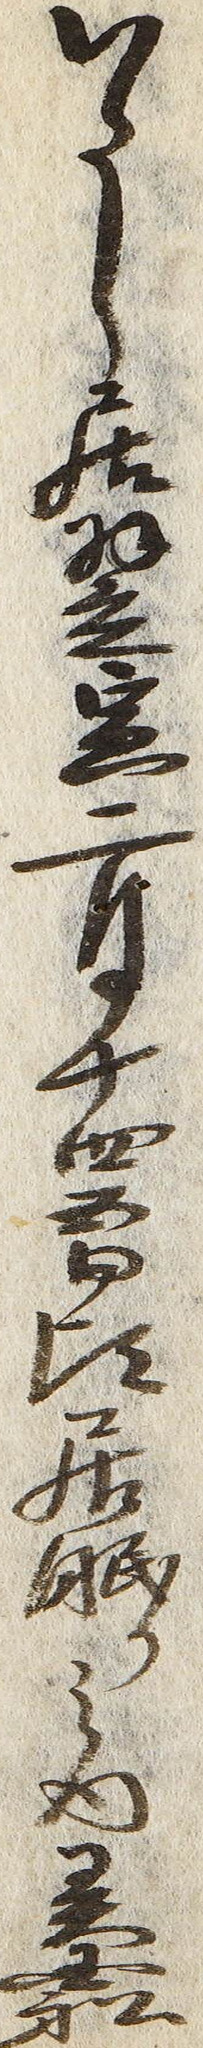いたし居翌寅二月十四五日頃居眠り之内異国舩
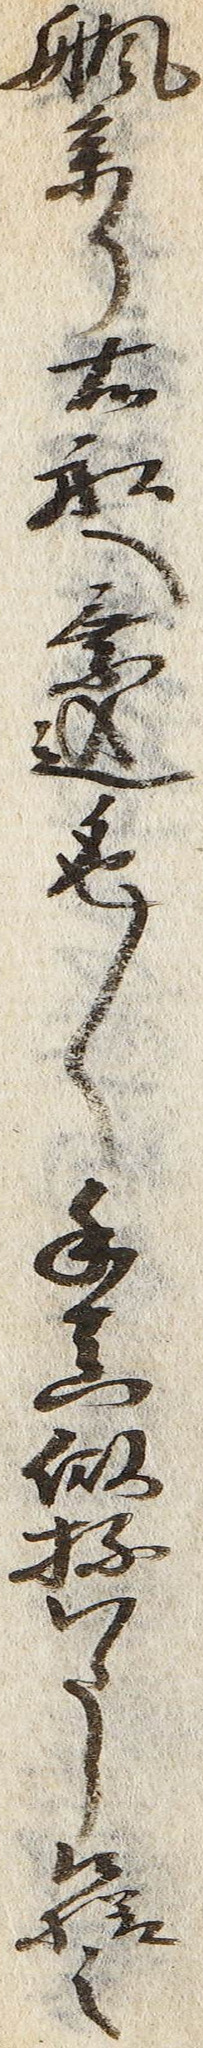䑺参り右舩へ乗込色々手真似抔いたし候様之
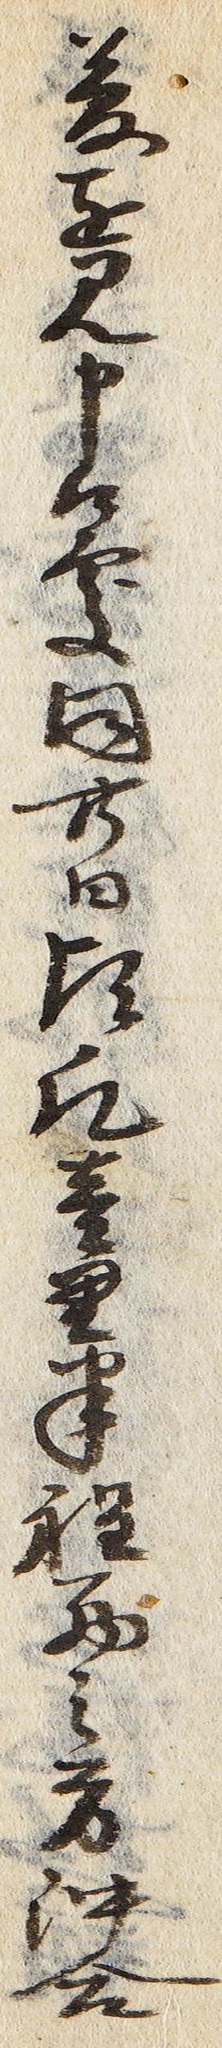夢を見申候處同廿日頃凡壹里半程西之方沖合
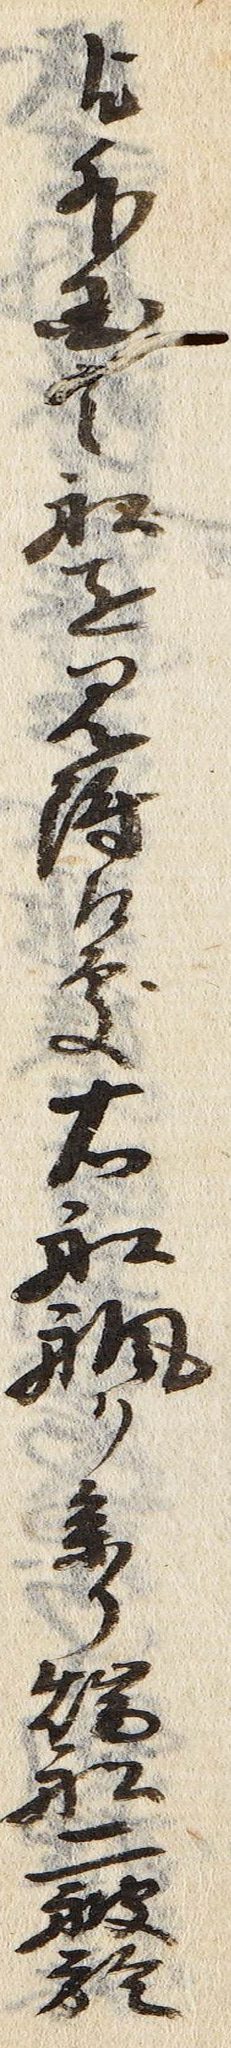江外国之舩を見附候處右舩䑺り参り端舩二艘於
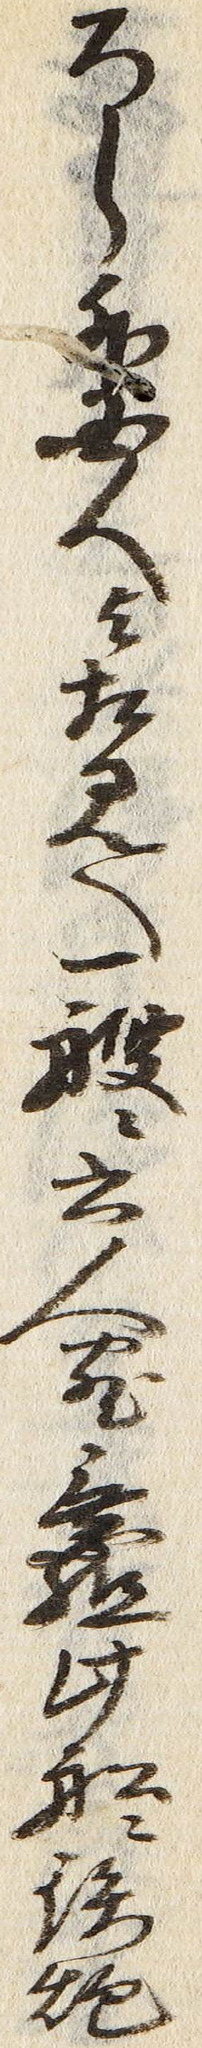ろし外国人と相見へ一艘ニ六人宛乗組此舩ニ鉄砲
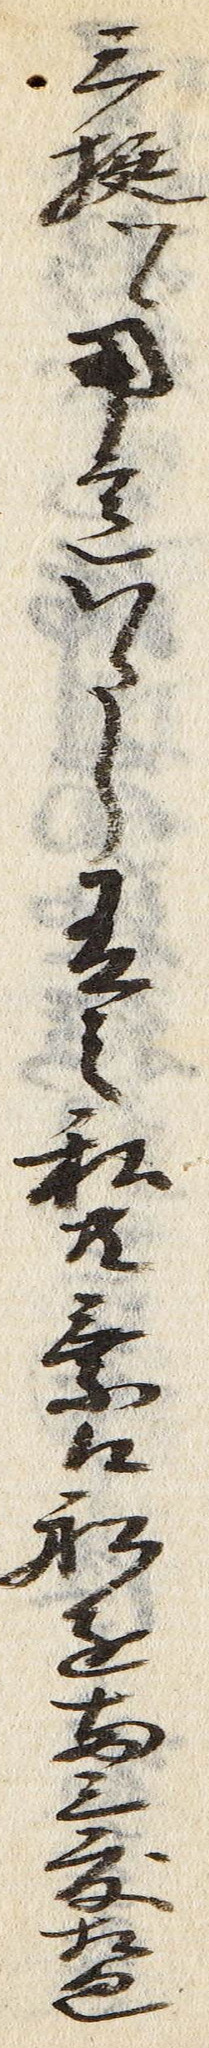三挺ツヽ用意いたし有之私共乗候舩を両三度相廻
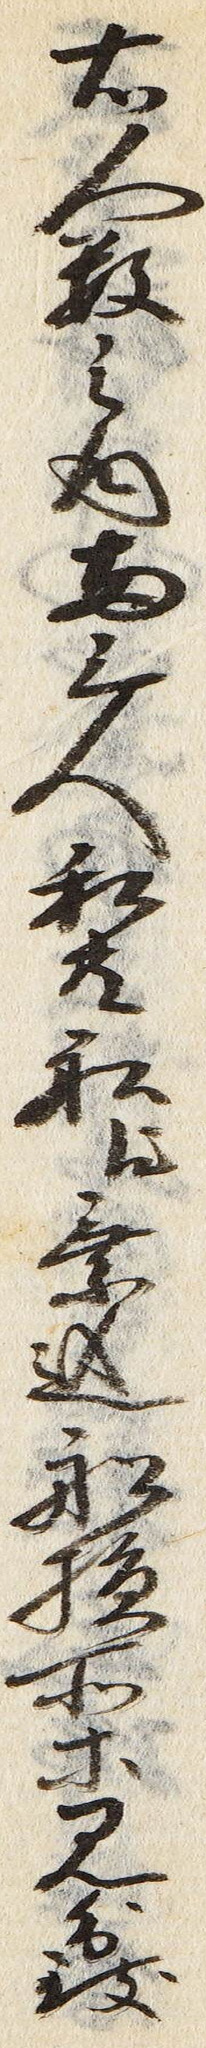右人数之内両三人私共舩江乗込舩損所等見分致
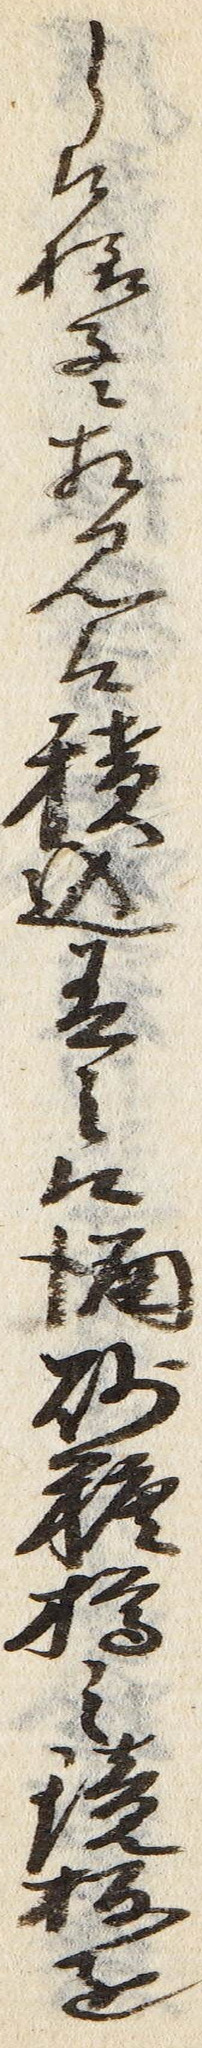し候様子ニ相見候積込有之酒砂糖樽之鏡板を
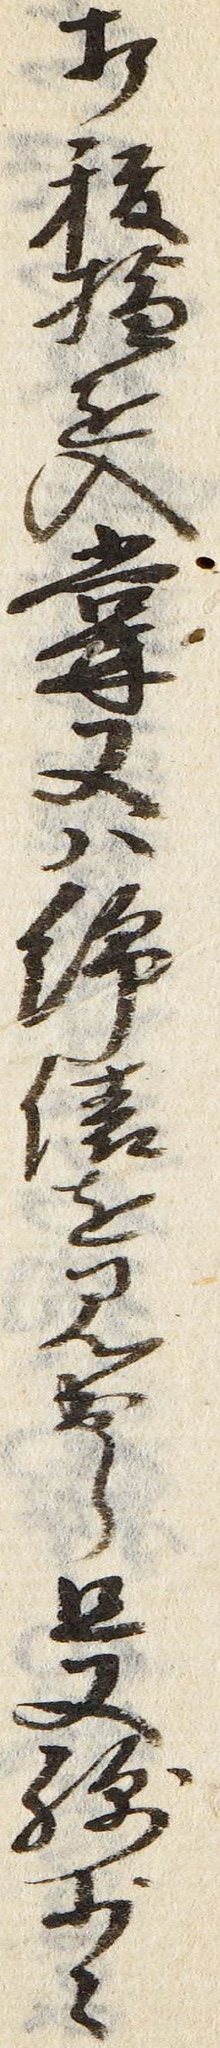打抜指を入掌又ハ綿俵を見出し且又綿少々
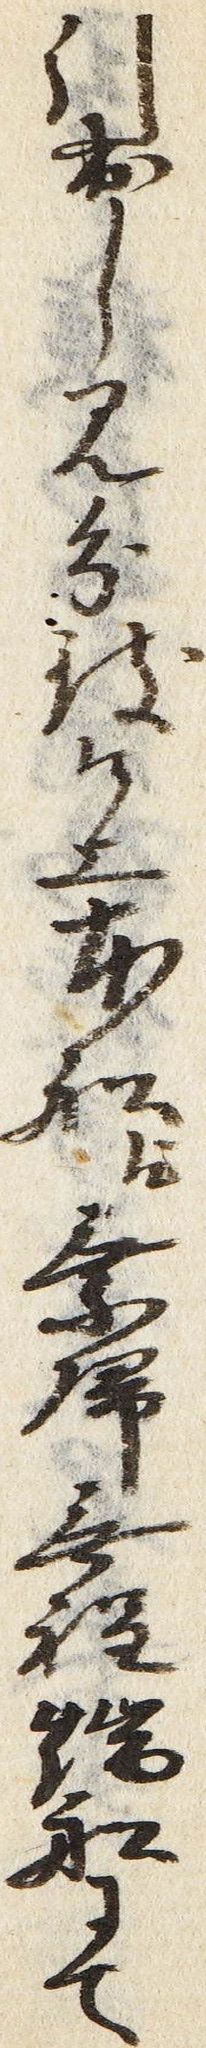引出し見分致候上本舩江乗帰無程端舩にて
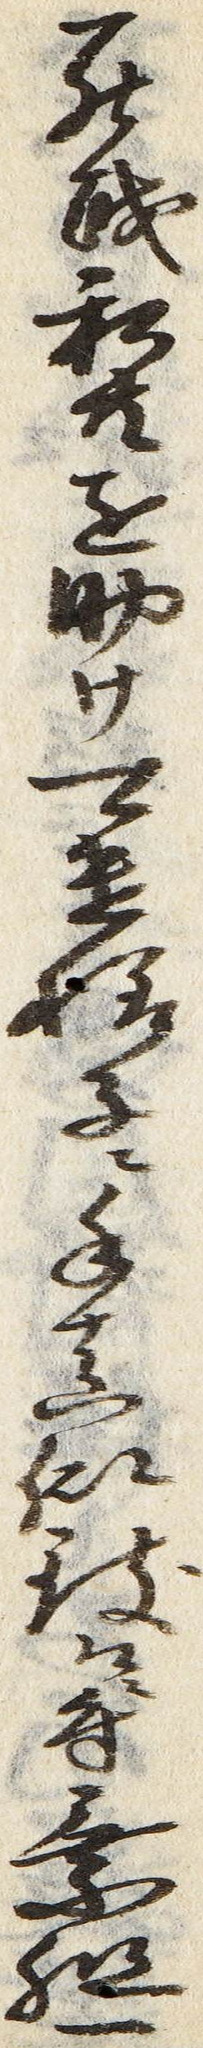罷越私共を助けて遣様子ニ手真似致候ニ付乗組一
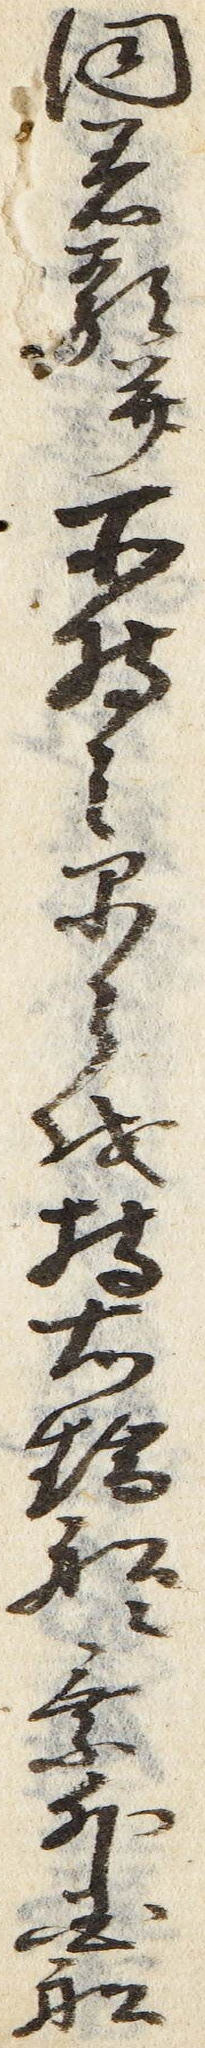同着類幷所持之品々を持右端舩ニ乗外国舩
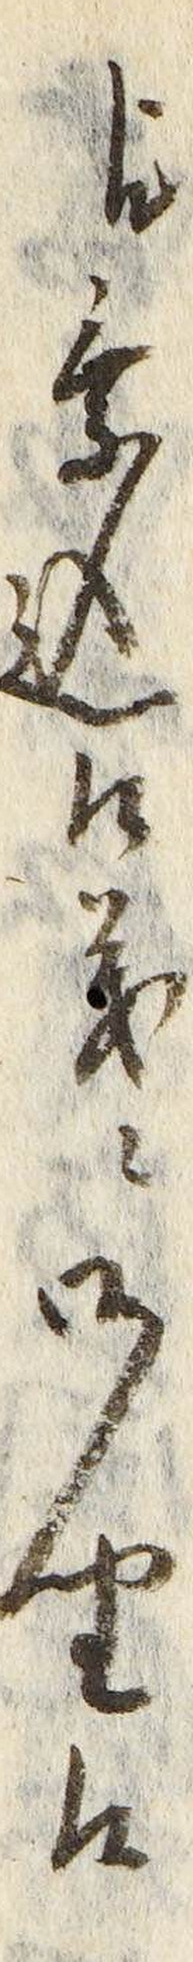江乗込候義ニ御座候

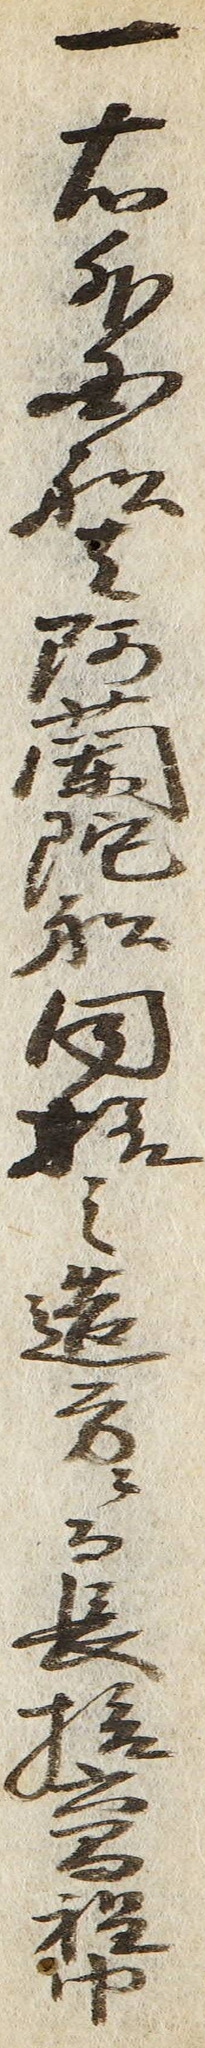一右外国舩者和蘭陀舩同様之造方ニ而長拾六間程巾
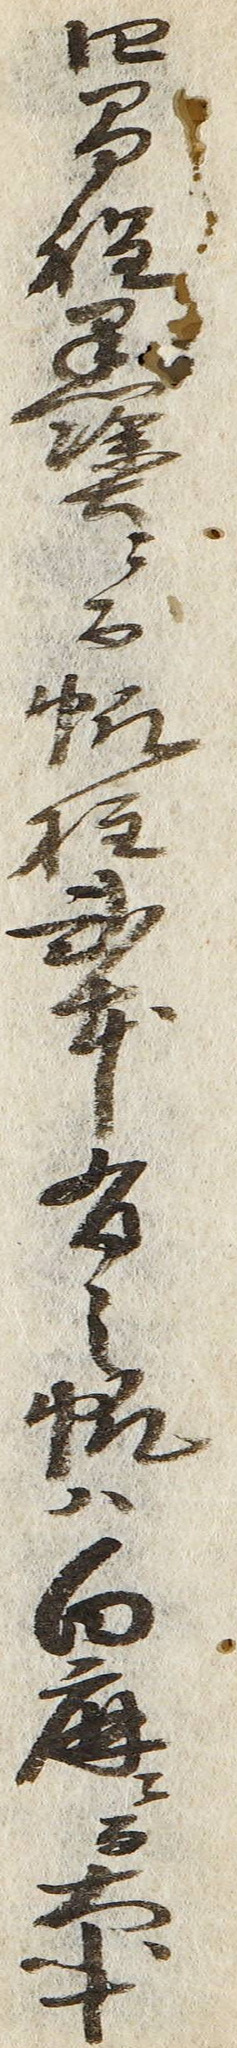四間程黒塗ニ而帆柱弐本有之帆ハ白麻ニ而大小十
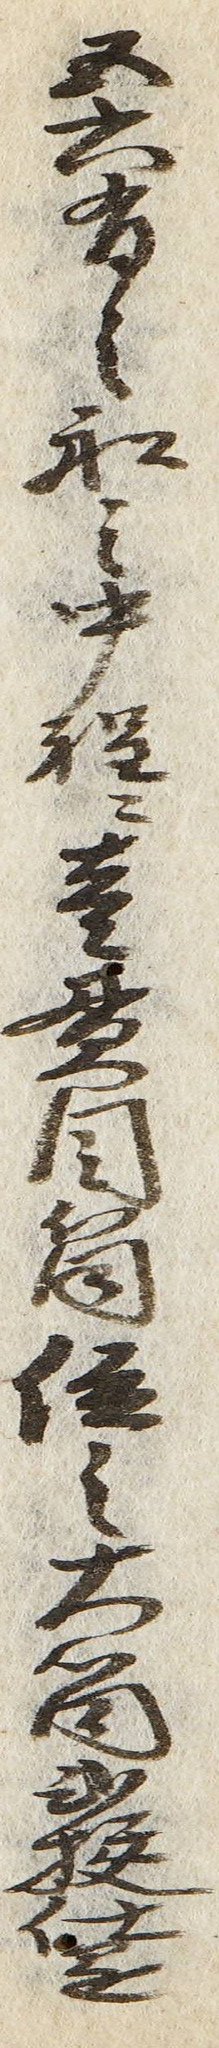五六有之舩之中程ニ壹貫目筒位之大筒弐挺仕懸
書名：漂流人善助聞書
